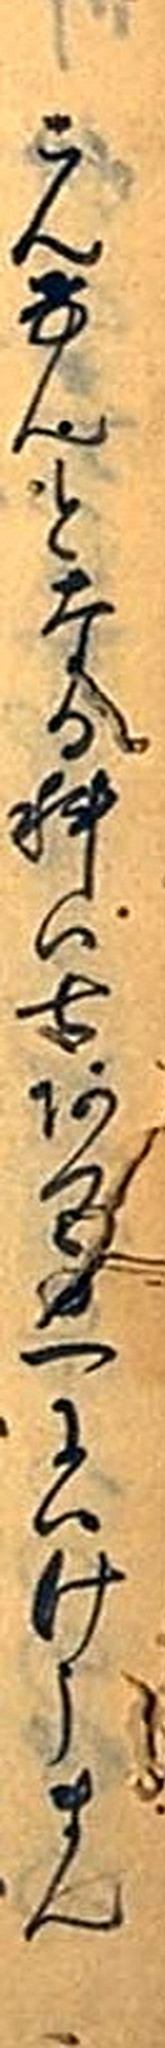こんけんとなる科は七あり○一にはけうまん
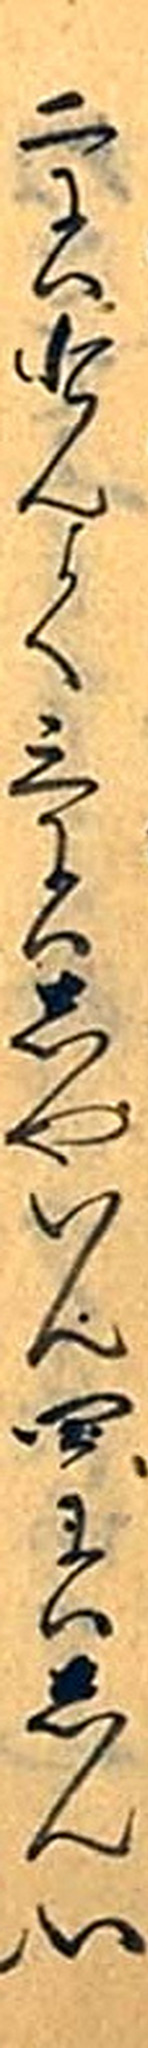二にはとんよく三にはしやいん四にはしんい
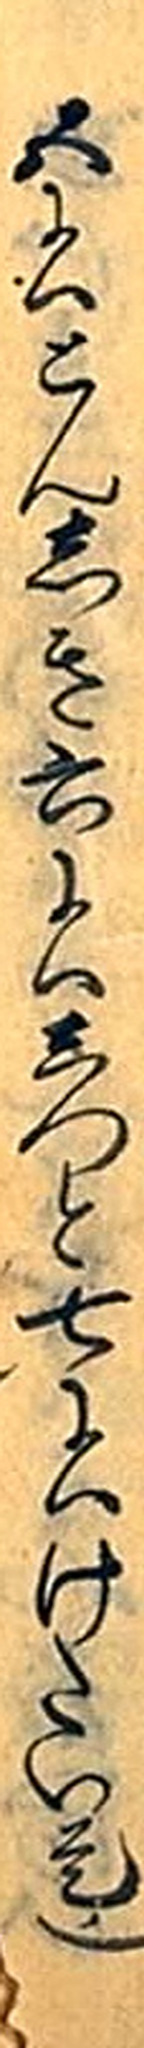五にはとんしき六にはしつと七にはけたい是也
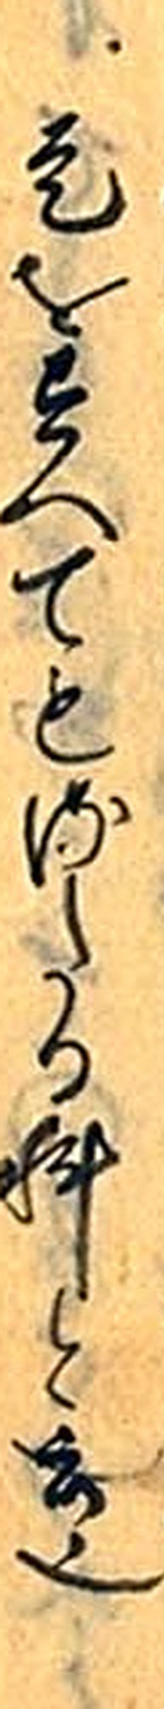是をすへてもるたる科と云也
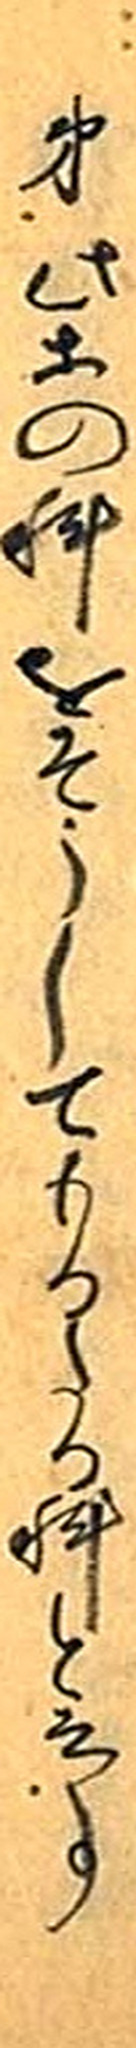弟此等の科をそうしてもるたる科と云事
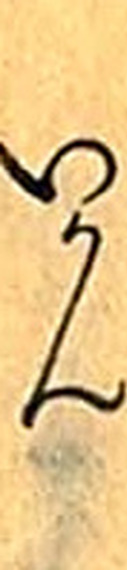いかん
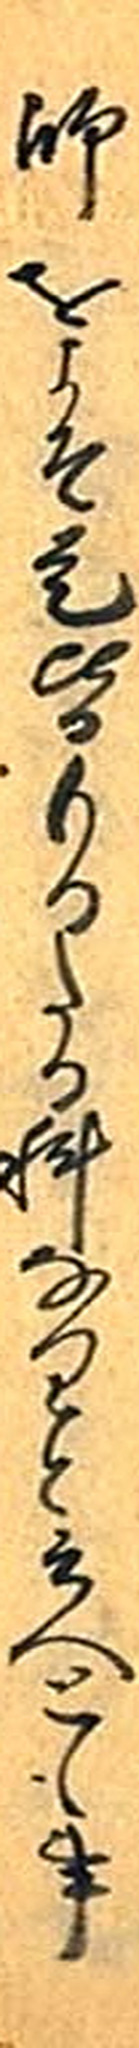師をよそ是皆もるたる科なりと云へとも事
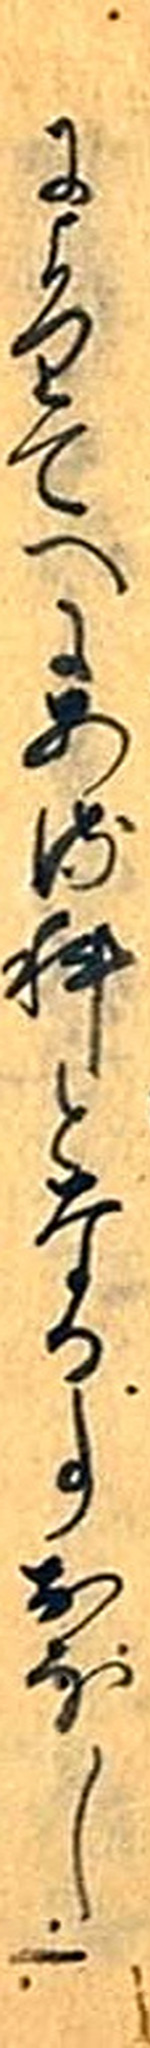によりてへにある科となる事おほし
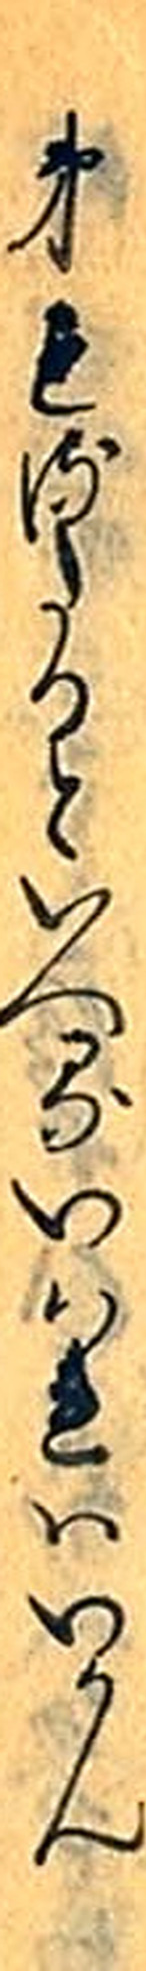弟もるたるといへるいはれはいかん
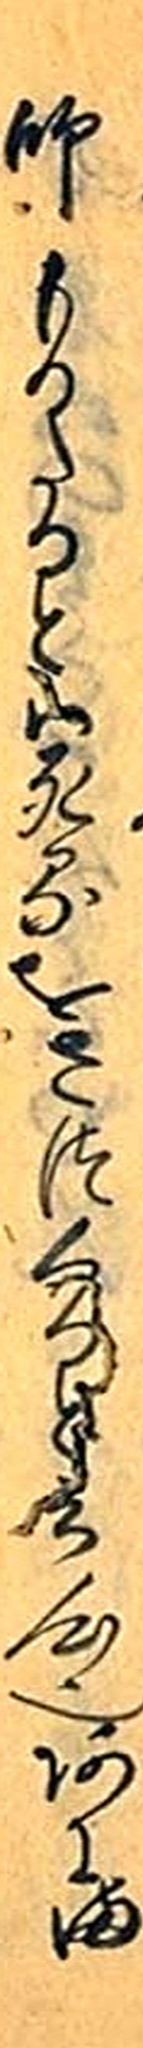師もるたるとは死るをさつくると云心也あにま
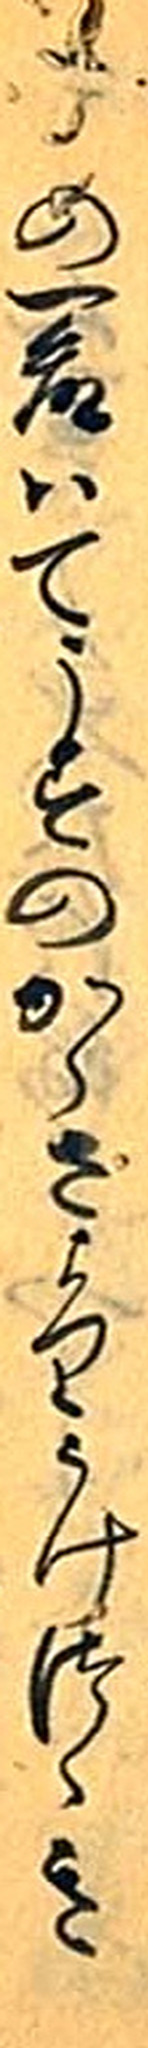の一命はてうすのからさよりうけつゝき
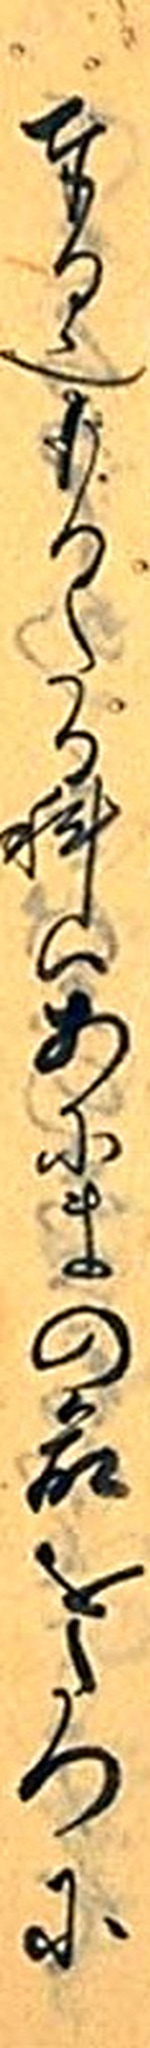奉る也もるたる科はあにまの命をたつに
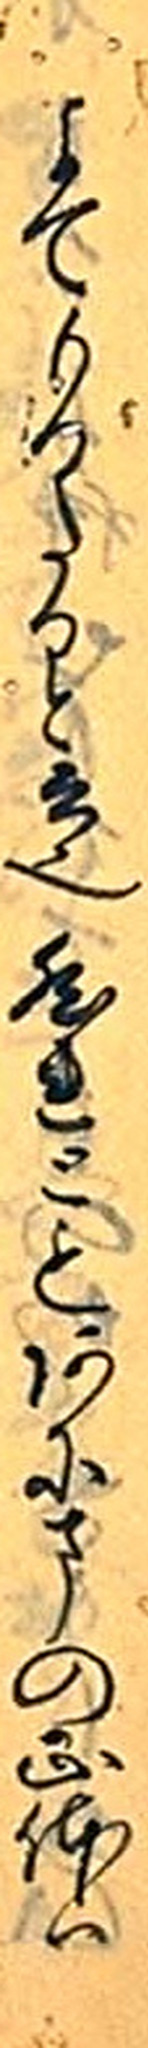よてもるたると云也然れともあにまの正体は
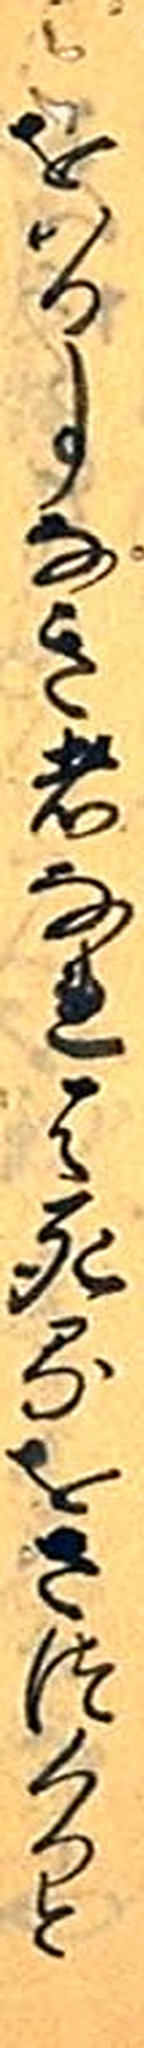をはる事なき者なれは死るをさつくると
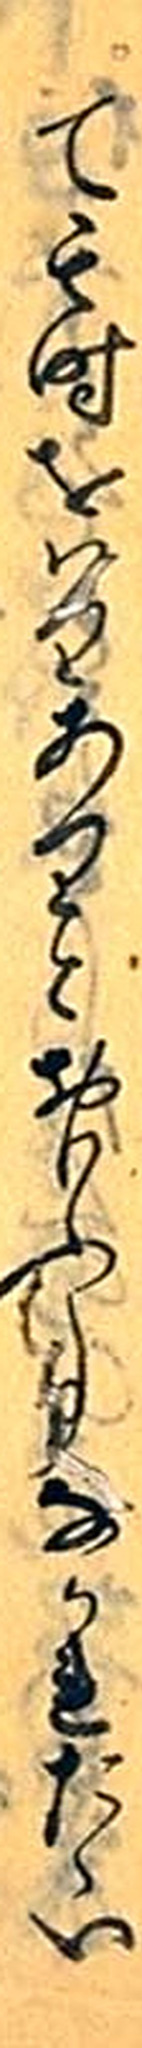て其時をはりありとおもふ事なかれたゝい
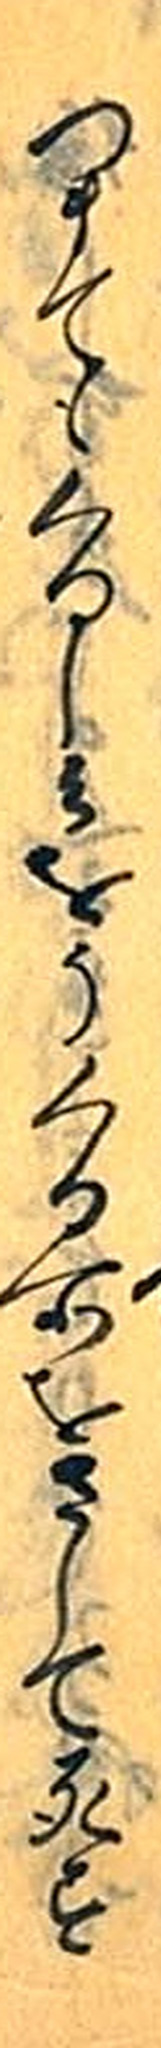つまてもくるしみをうくる所をさして死す
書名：ドチリナ・キリシタン
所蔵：東京大学総合図書館 / General Library in the University of Tokyo
